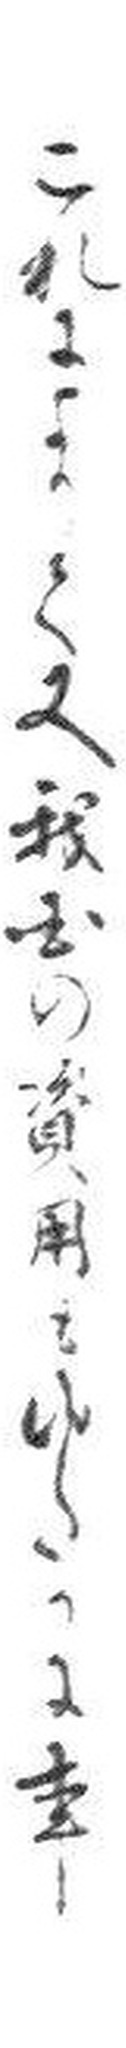これによりて又我国の資用もゆたかに事
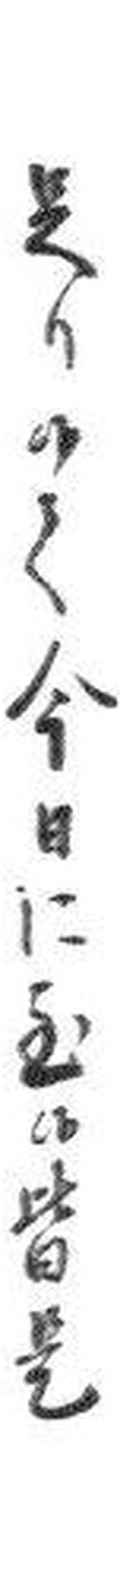足り候て今日に至候皆是
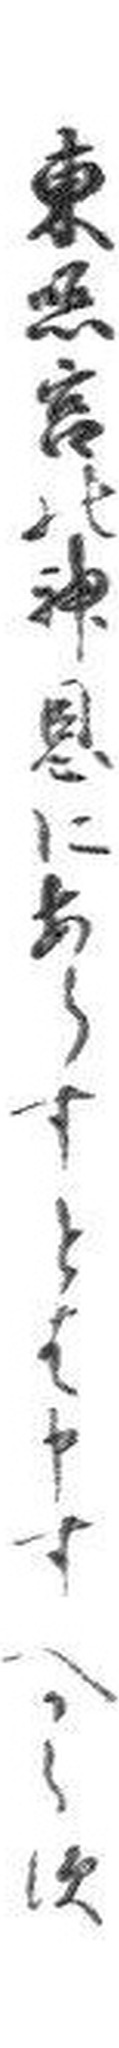東照宮の神恩にあらすとは申すへからす
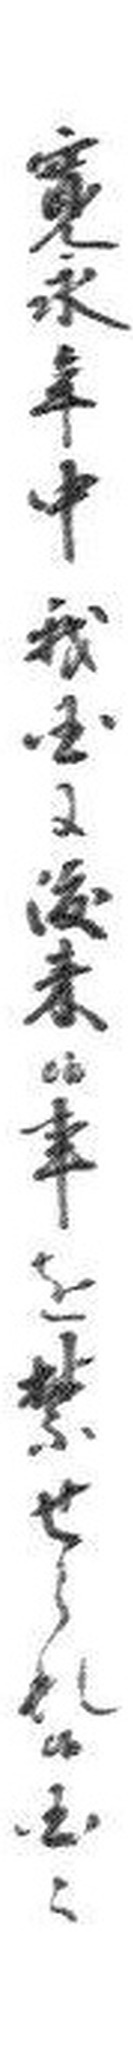寛永年中我国に渡来候事を禁せられ候国々
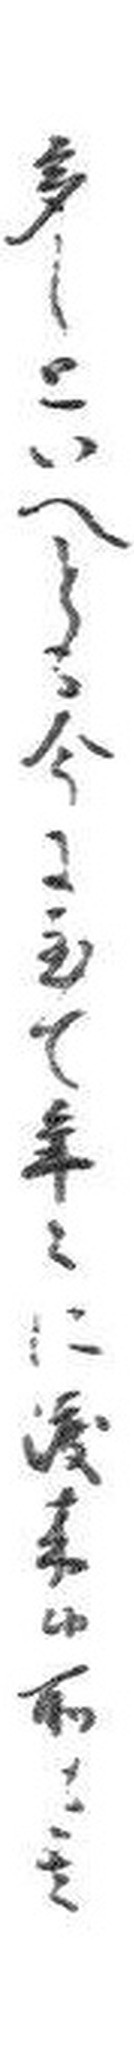多しといへとも今に至て年々に渡来候所も其
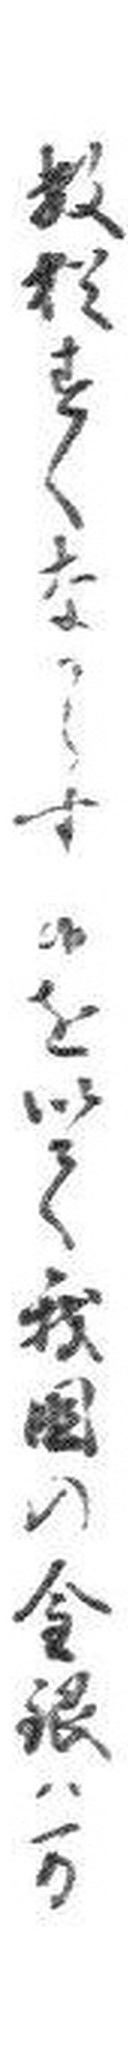数猶すくなからす候を以て我国の金銀ハ万
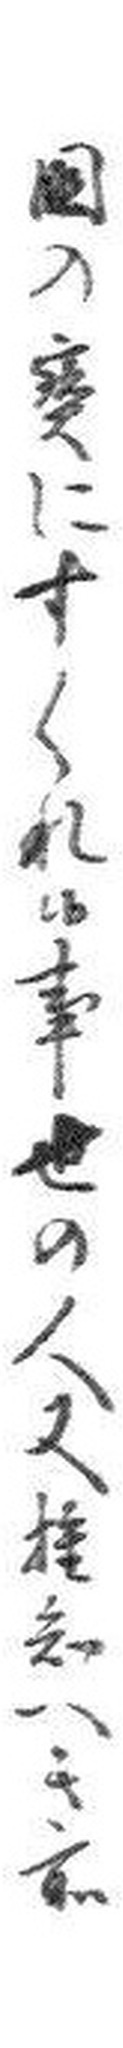国の宝にすくれ候事世の人又推知へき所
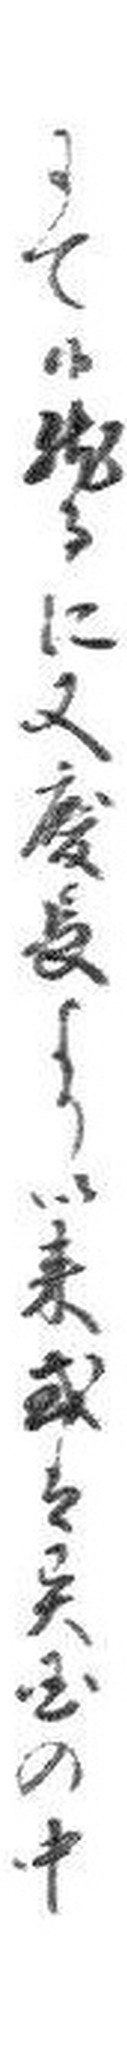にて候然るに又慶長より以来或は異国の中
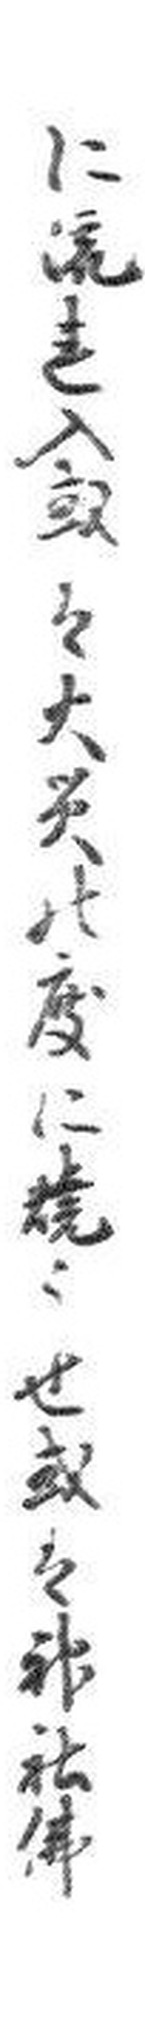に流れ入或は大災の度に焼うせ或は神社仏
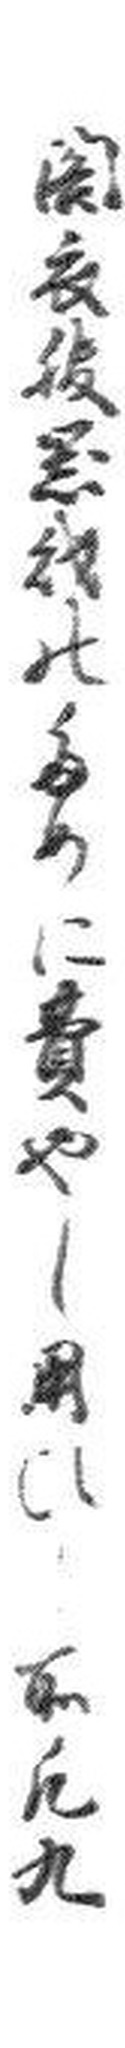閣衣服器財のために費やし用ひし所凡九

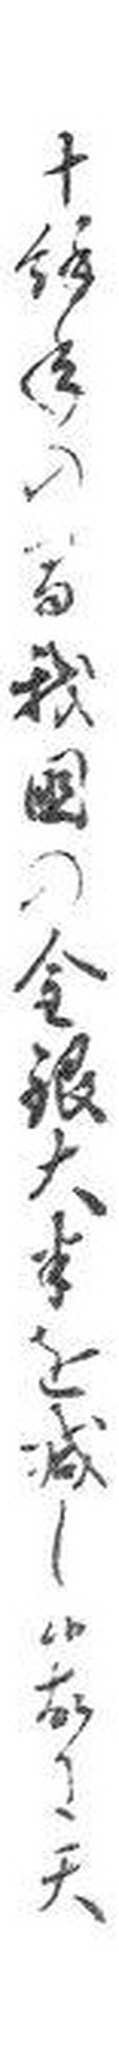十余年の間我国の金銀大半を減し候故に天
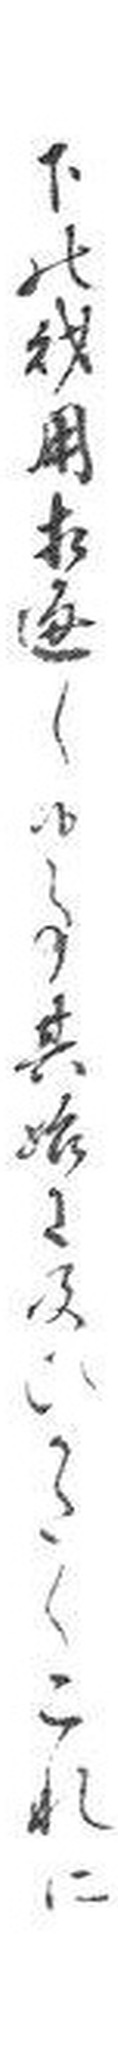下の財用相通し候事其始に及ひかたくこれに
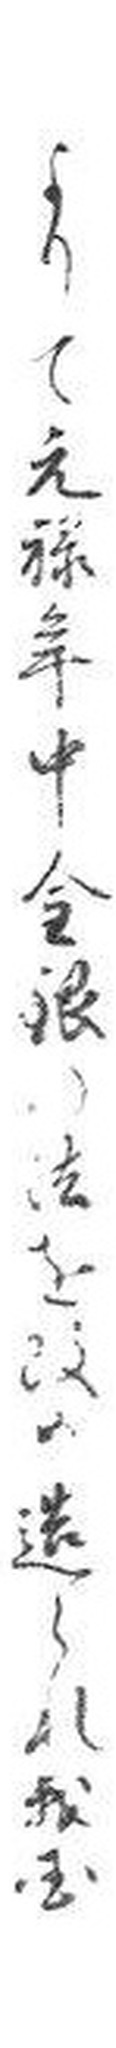よりて元禄年中金銀の法を改め造られ我国
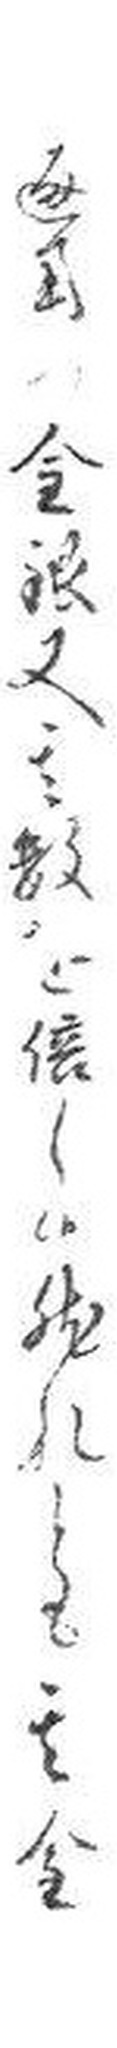通用の金銀又其数を倍し候然れとも其金
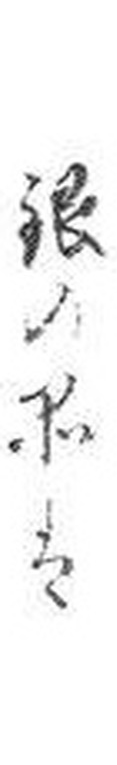銀の品は
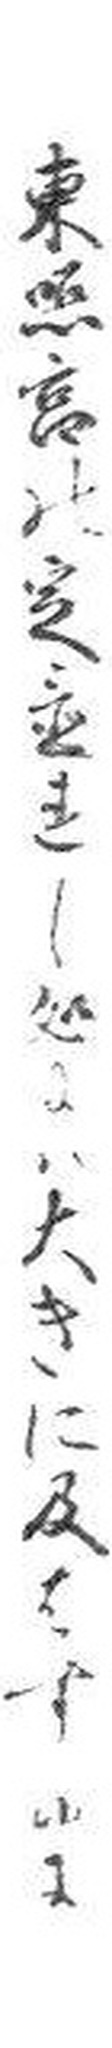東照宮の定置れし処には大きに及はす候に
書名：家譜 二十九 吉邦公 従正徳二年到正徳三年
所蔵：福井県文書館 Fukui Prefectural Archives
